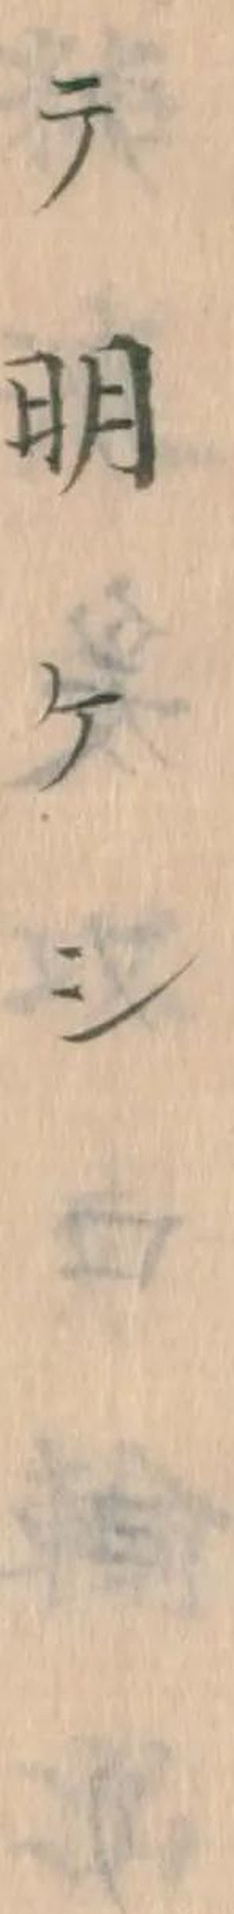テ明ケシ
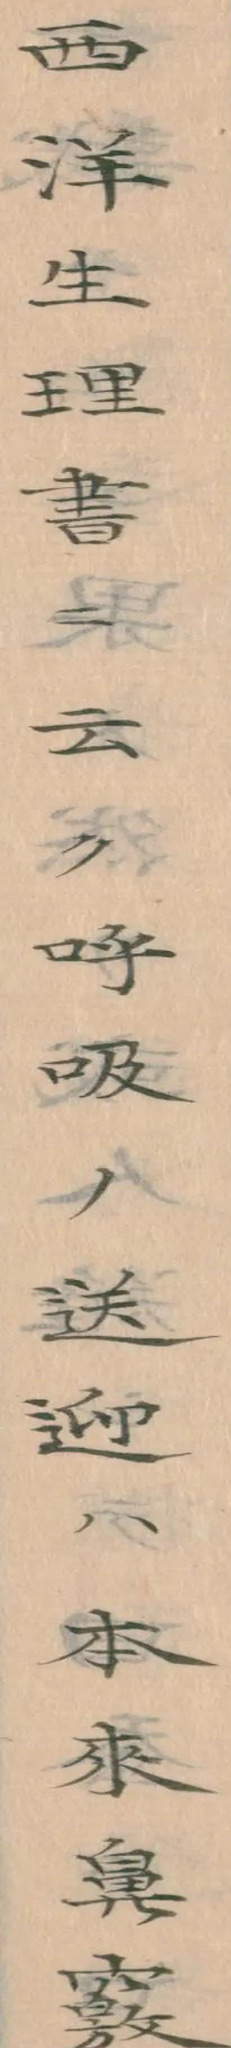西洋生理書ニ云ク呼吸ノ送迎ハ本来鼻竅
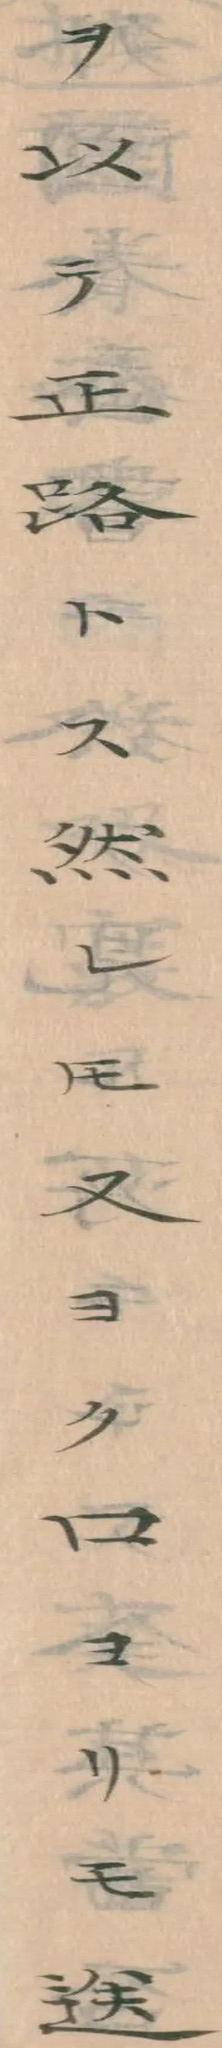ヲ以テ正路トス然レトモ又ヨク口ヨリモ送
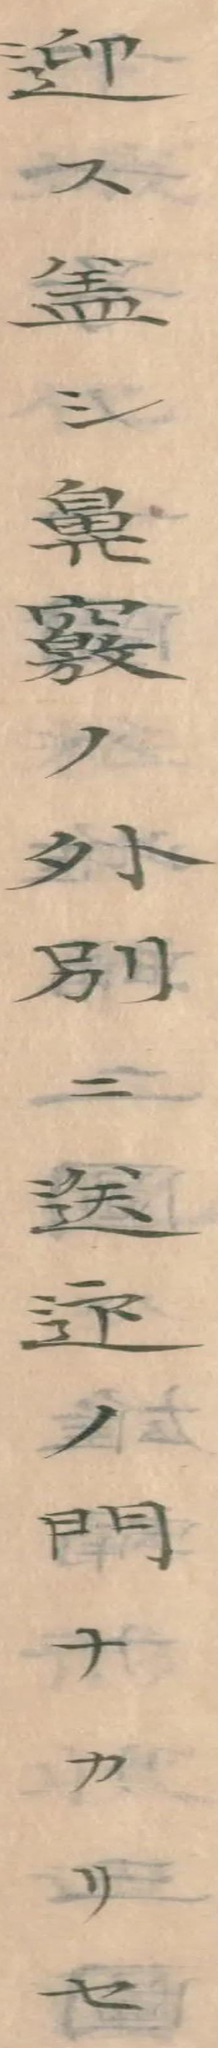迎ス蓋シ鼻竅ノ外別ニ送迎ノ門ナカリセ
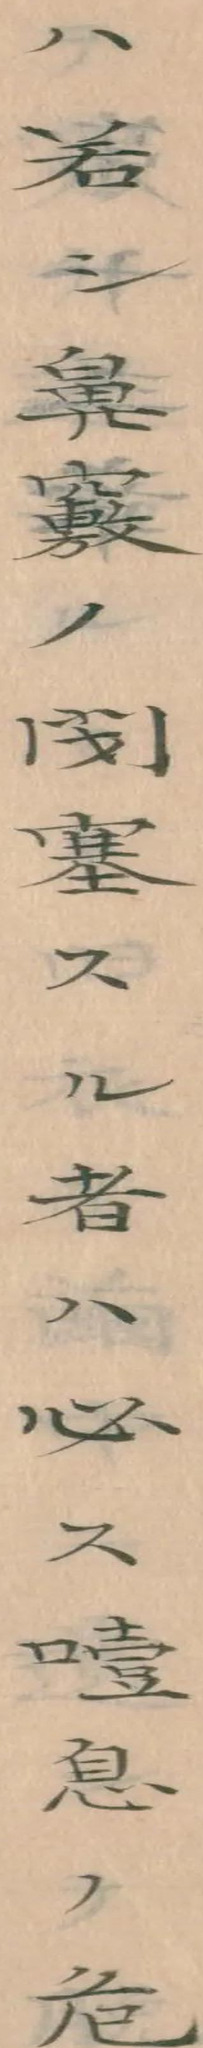ハ若シ鼻竅ノ閉塞スル者ハ必ス噎息ノ危
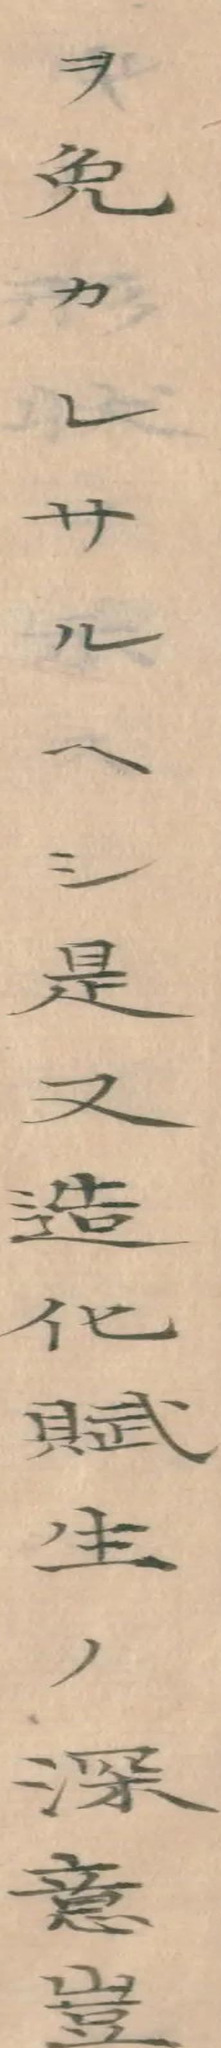ヲ免カレサルヘシ是又造化賦生ノ深意豈
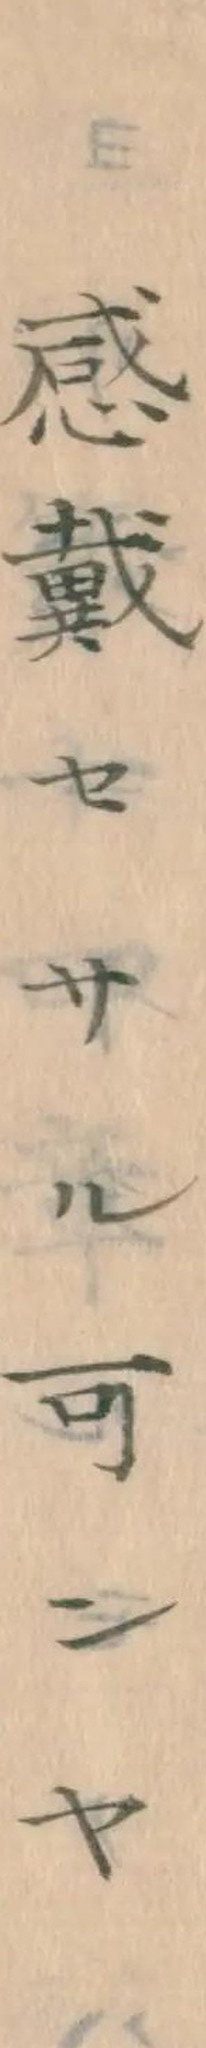感戴セサル可ンヤ
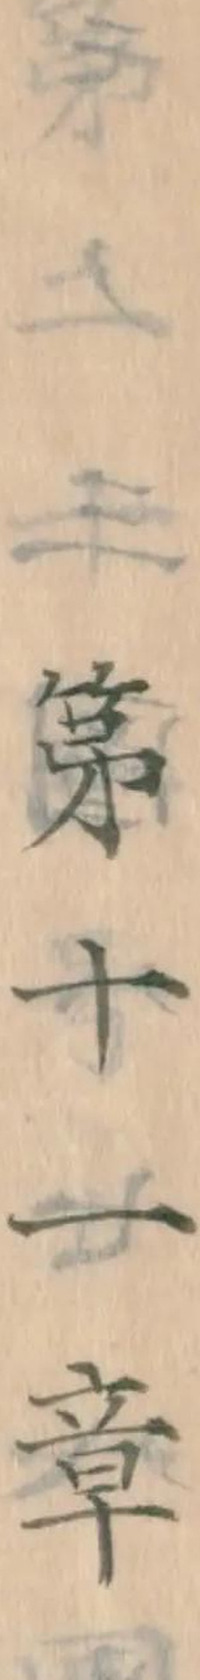第十一章
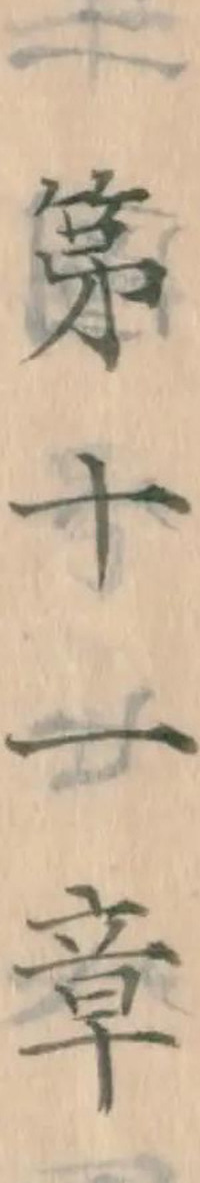第十一章
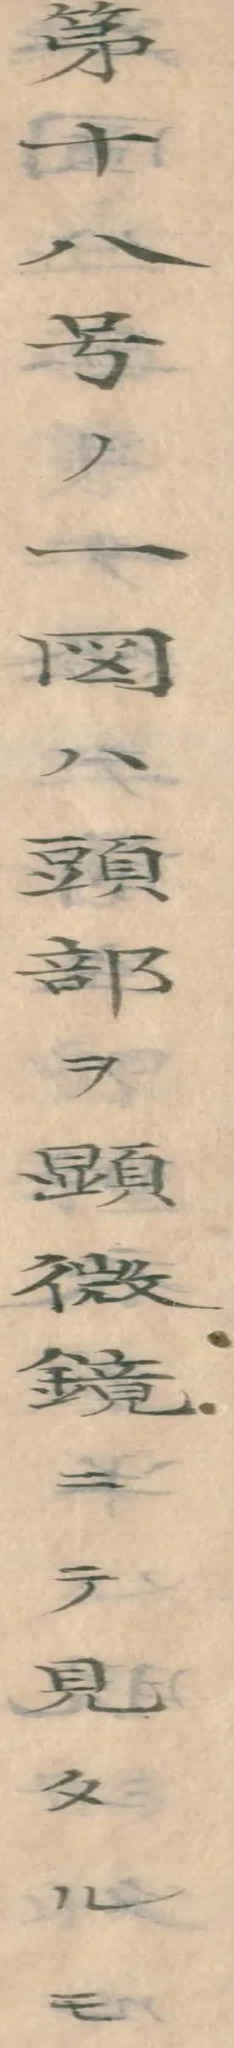第十八号ノ一図ハ頭部ヲ顕微鏡ニテ見タルモ
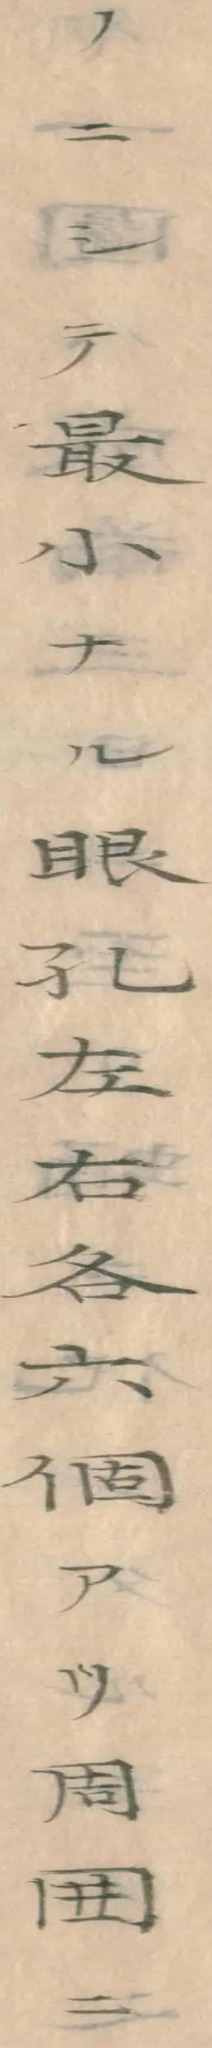ノニシテ最小ナル眼孔左右各六個アリ周囲ニ
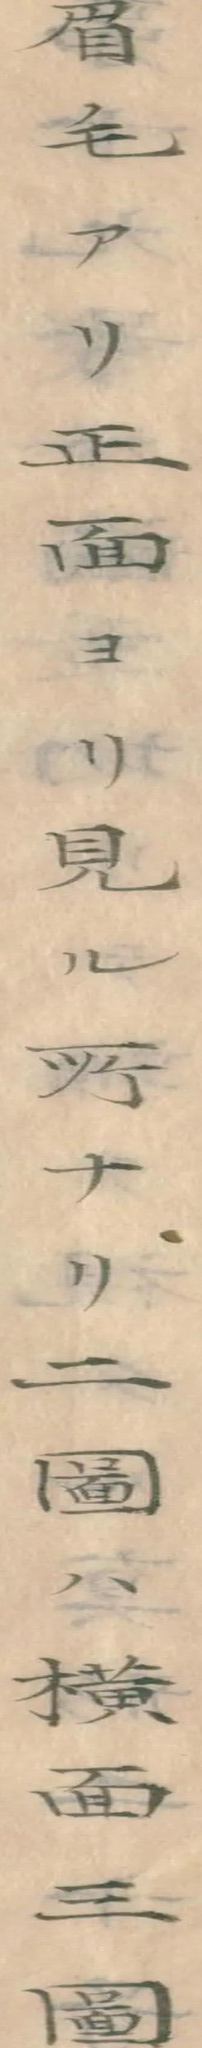眉毛アリ正面ヨリ見ル所ナリ二図ハ横面三図
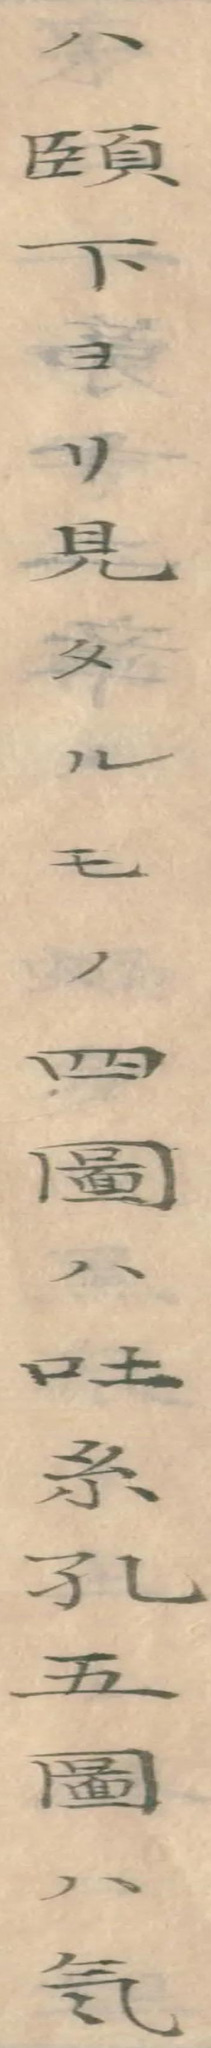ハ頤下ヨリ見タルモノ四図ハ吐糸孔五図ハ気
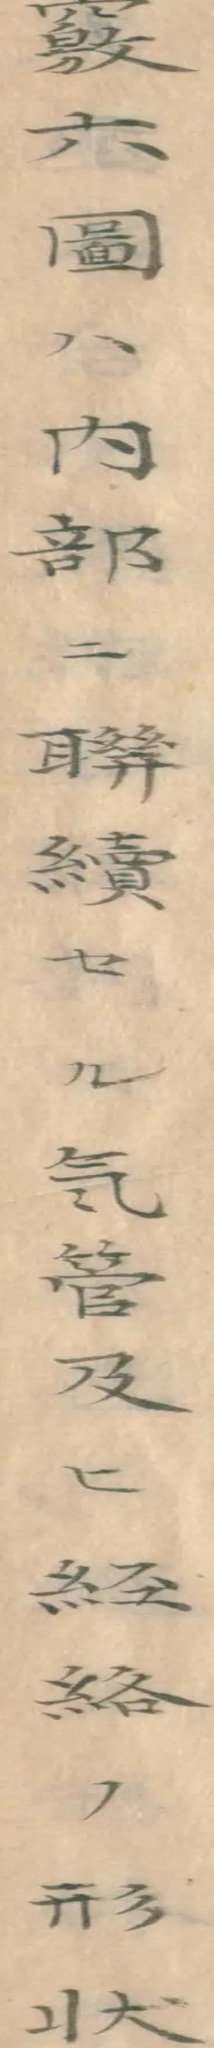竅六図ハ内部ニ聯続セル気管及ヒ経絡ノ形状

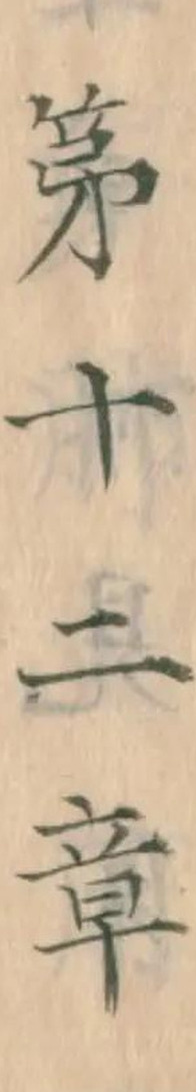第十二章
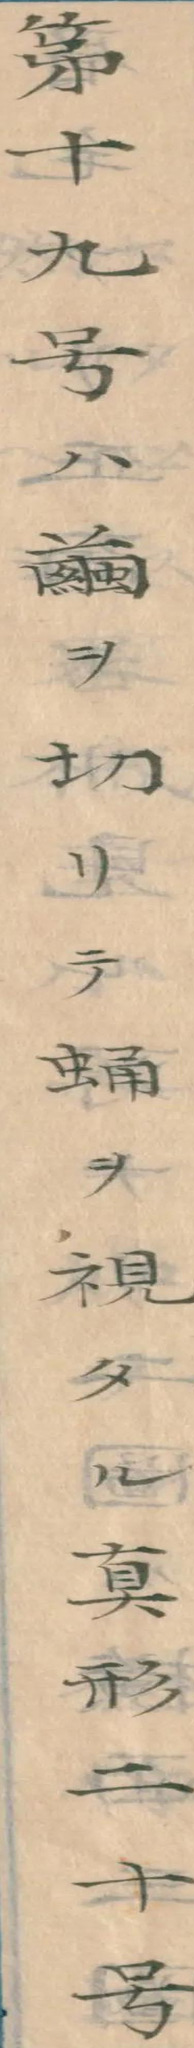第十九号ハ繭ヲ切リテ蛹ヲ視タル真形二十号
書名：蚕桑集成
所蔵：国立国会図書館 National Diet Library, JAPAN
